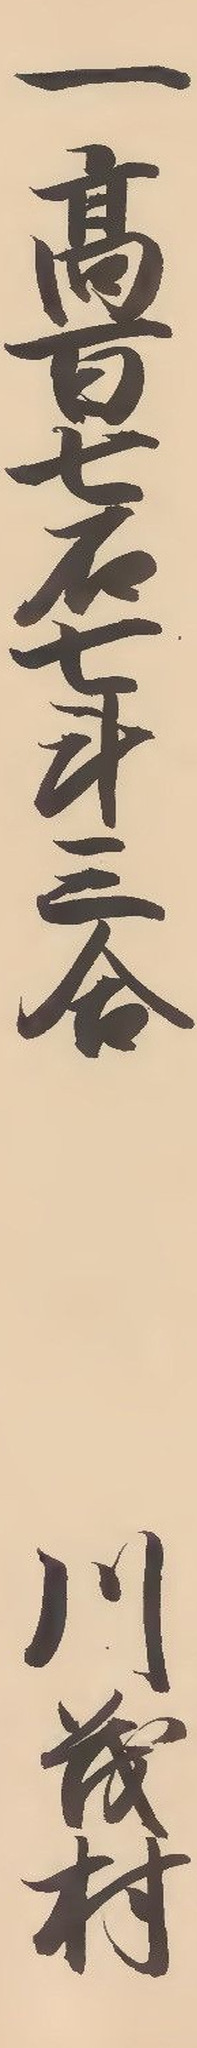一高百七石七斗三合川茂村
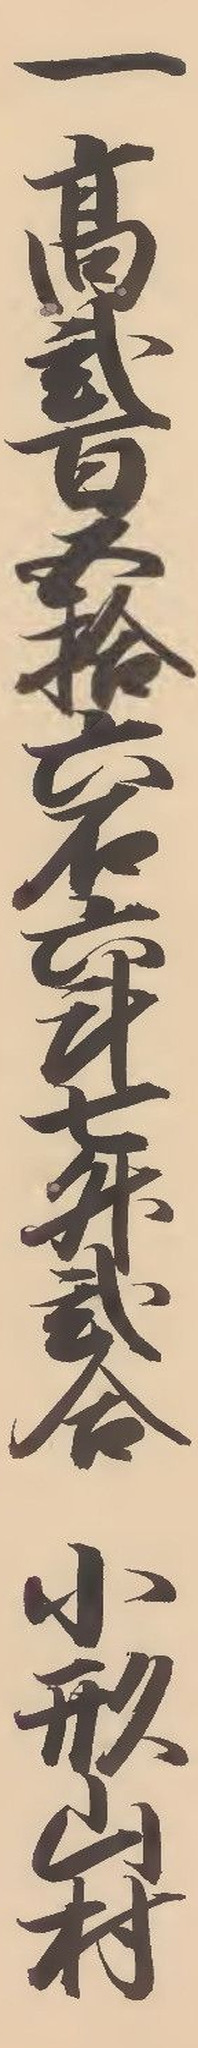一高弐百五拾六石六斗七升弐合小形山村

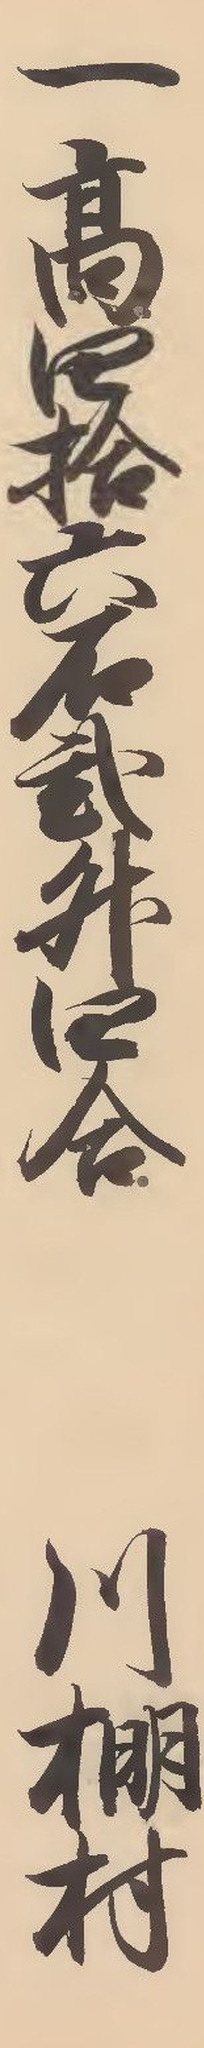一高四拾六石弐升四合川棚村
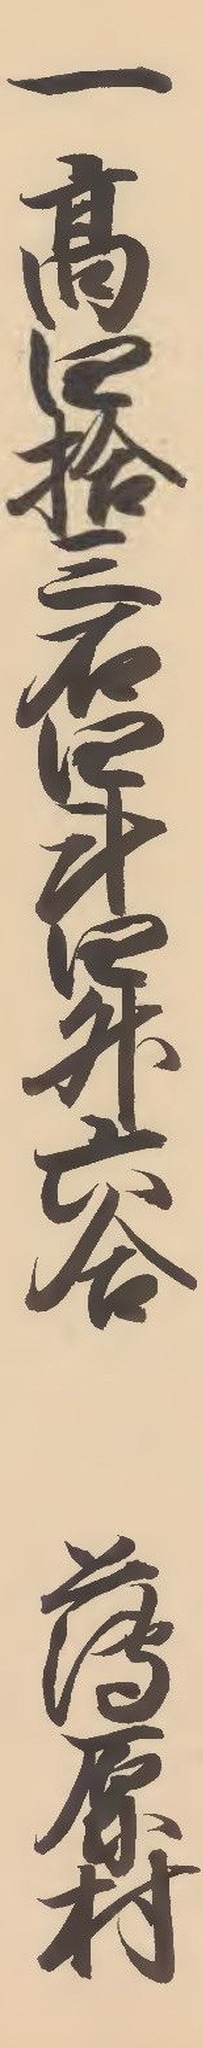一高四拾三石四斗四升六合薄原村
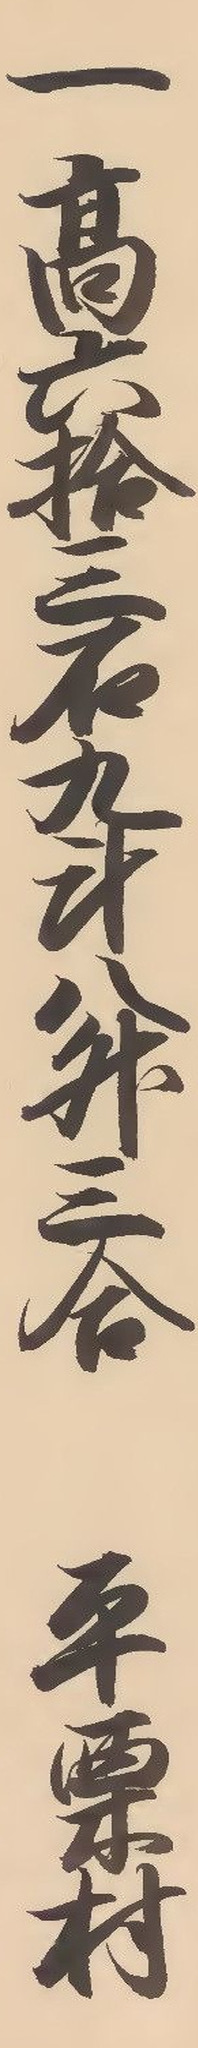一高六拾三石九斗八升三合平栗村
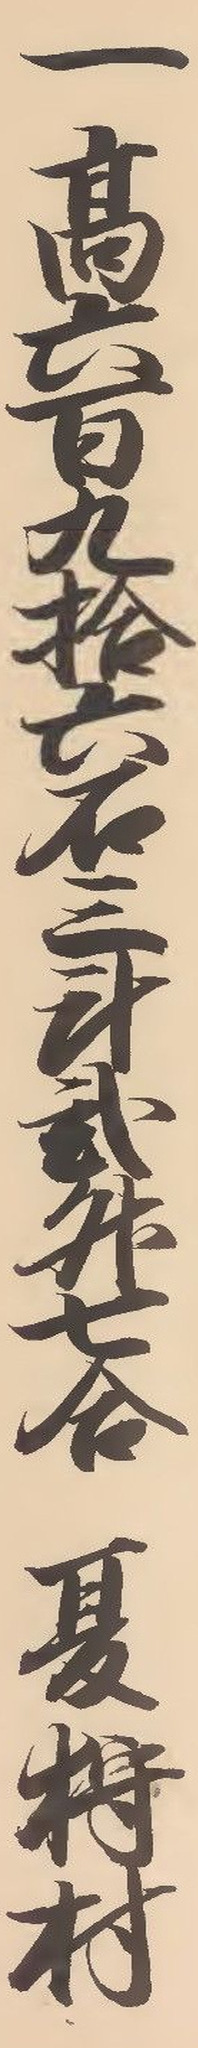一高六百九拾六石三斗弐升七合夏狩村
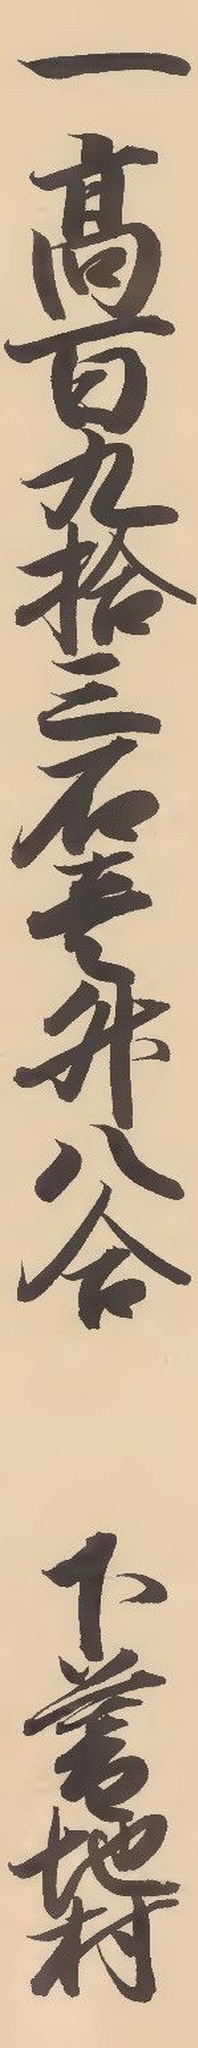一高百九拾三石壱升八合下暮地村
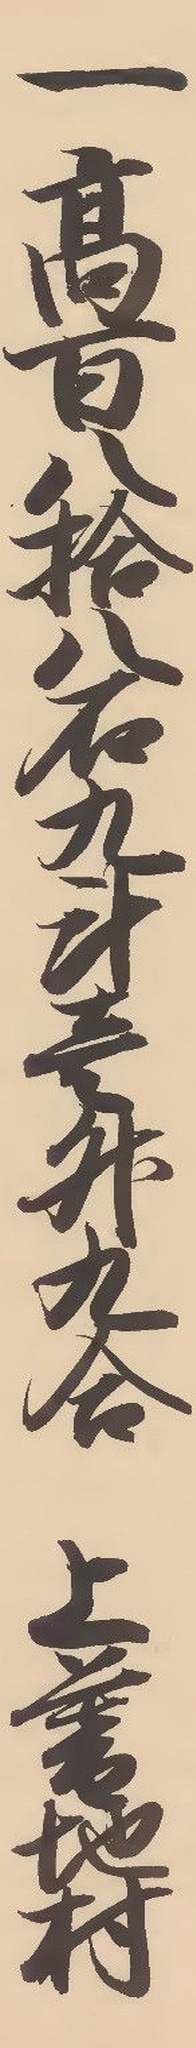一高百八拾八石九斗壱升九合上暮地村
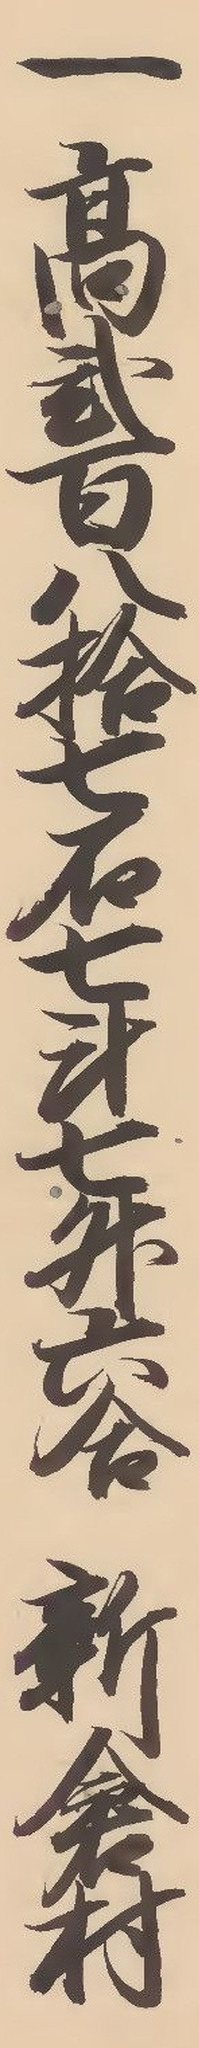一高弐百八拾七石七斗七升六合新倉村

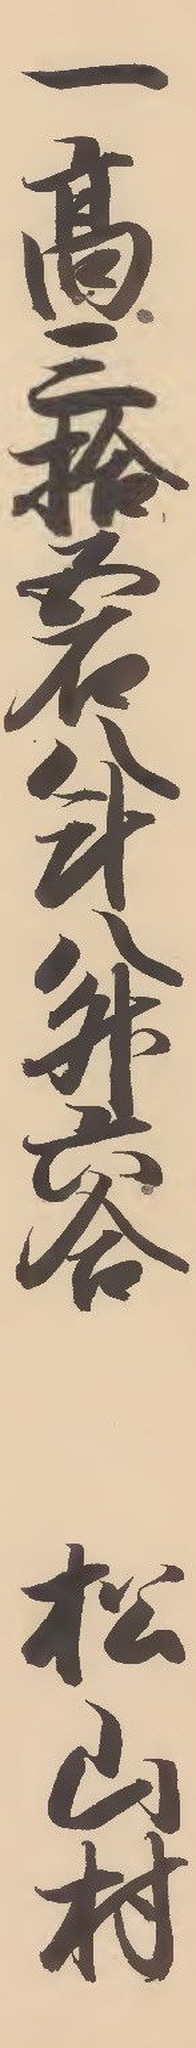一高三拾五石八斗八升六合松山村
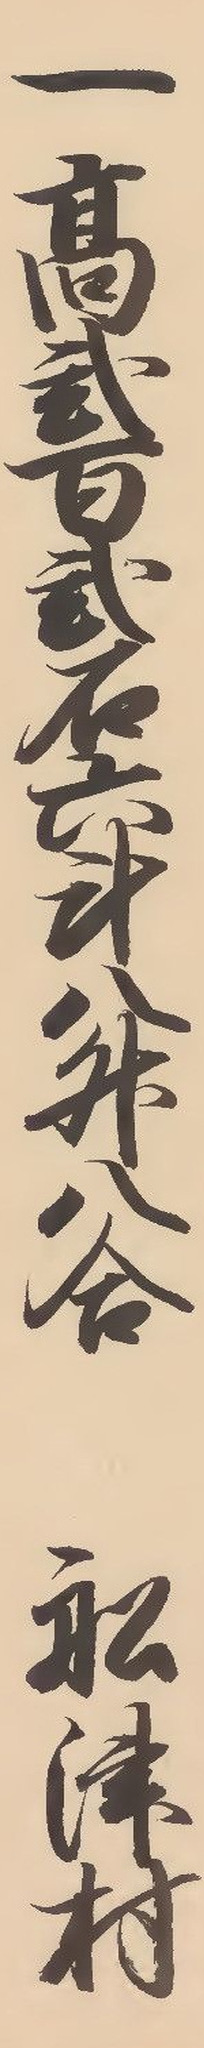一高弐百弐石六斗八升八合船津村
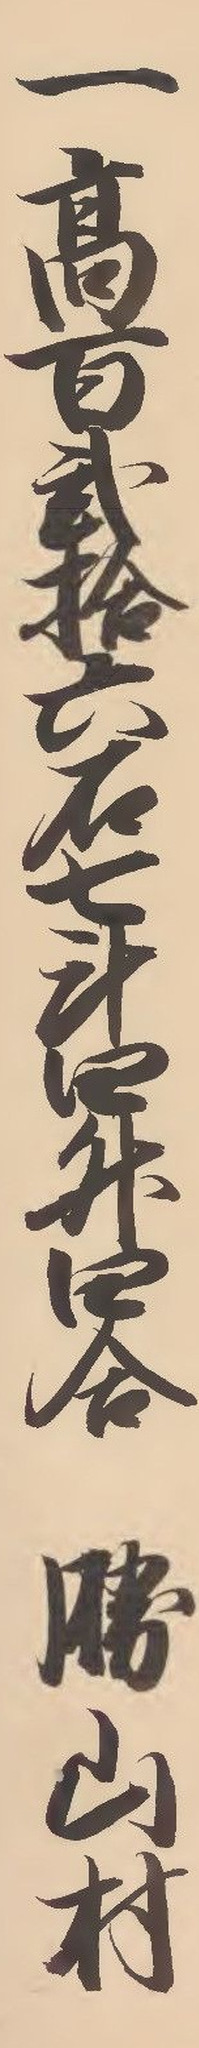一高百弐拾六石七斗四升四合勝山村
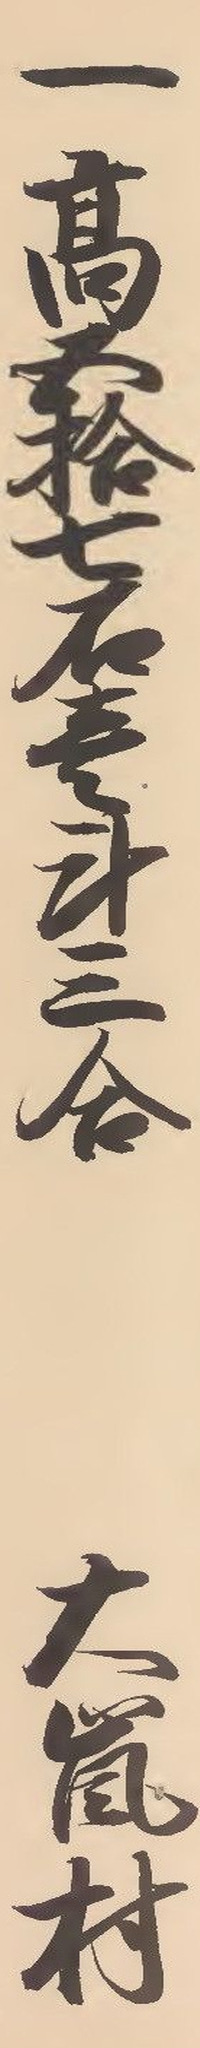一高五拾七石壱斗三合大嵐村
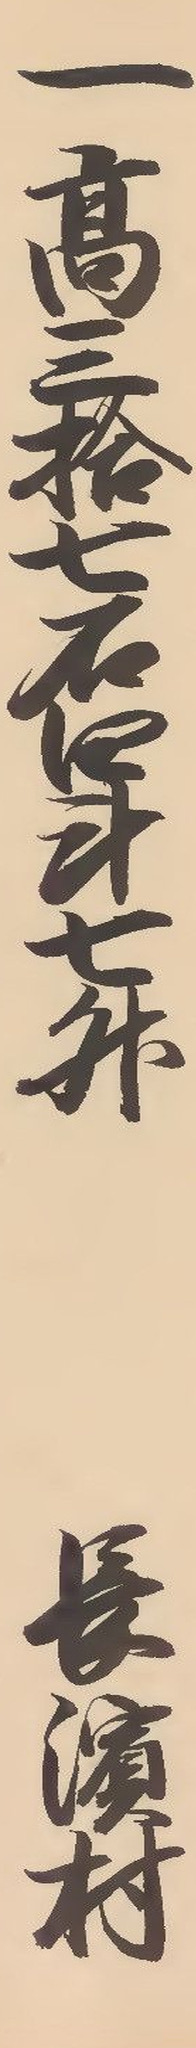一高三拾七石四斗七升長浜村
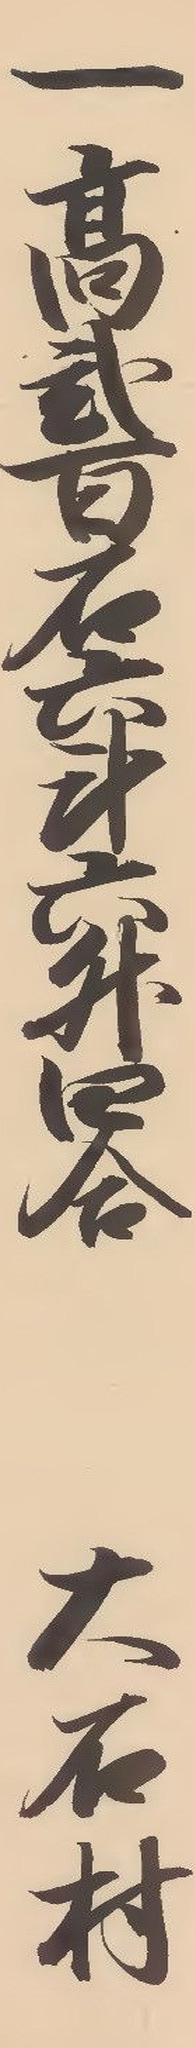一高弐百石六斗六升四合大石村
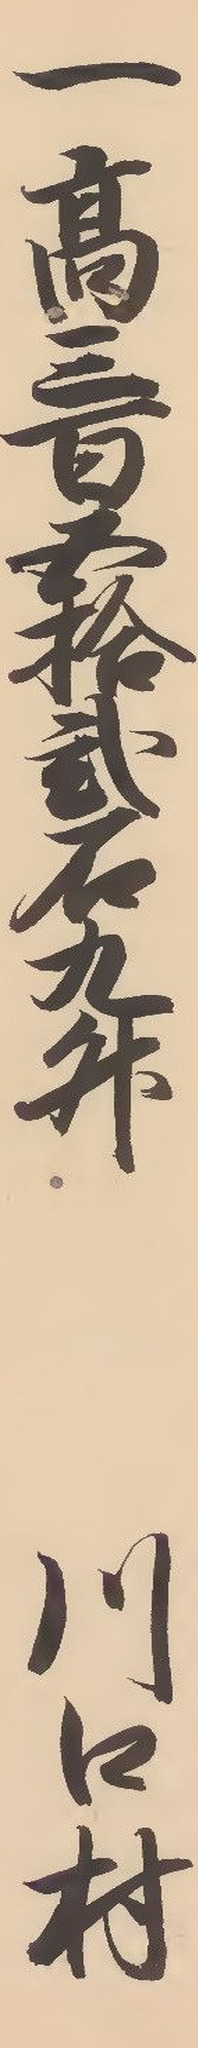一高三百五拾弐石九升川口村
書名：甲斐国郷帳
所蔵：国立公文書館 National Archives of Japan
